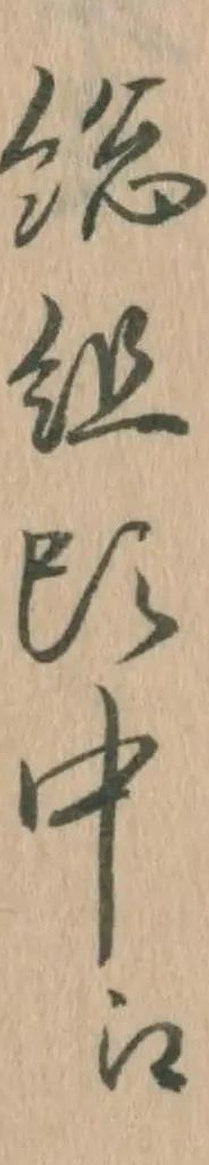総組頭中江
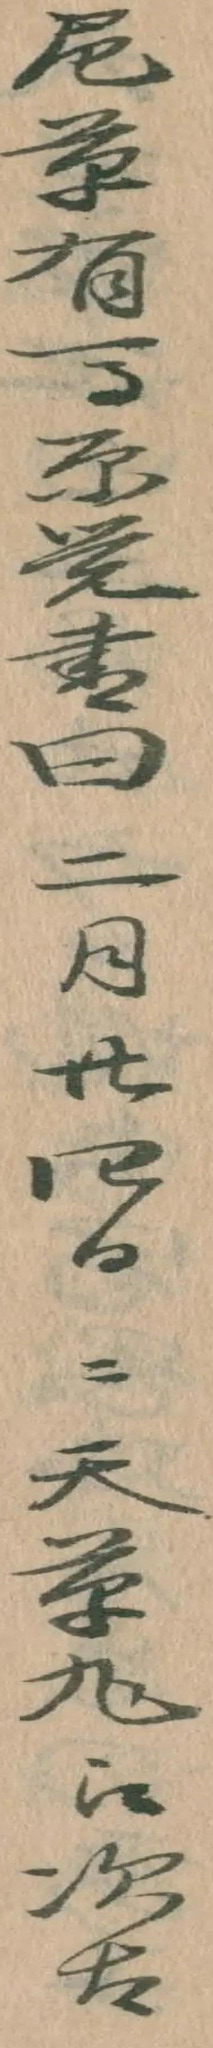尼草有馬原覚書曰二月廿四日に天草丸江次太
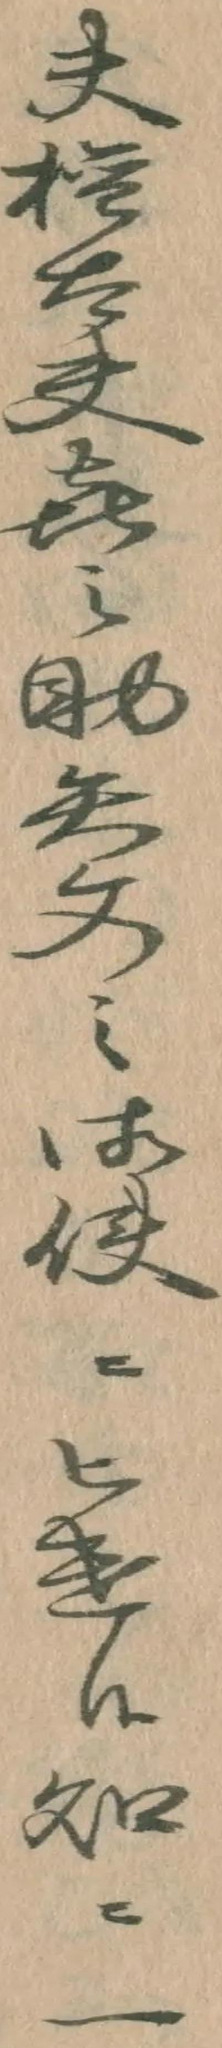夫権太夫喜之助矢文之御使に被遣候処に一
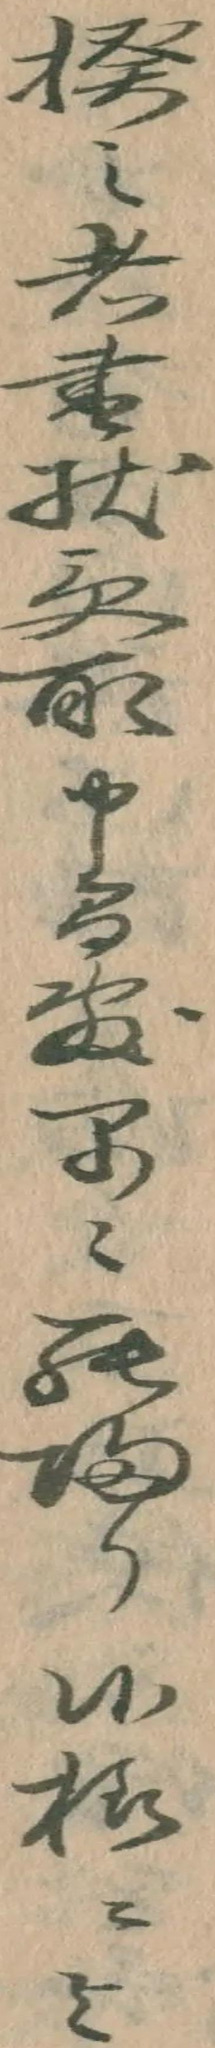揆之者書状受取申間敷早々罷帰り候様に与
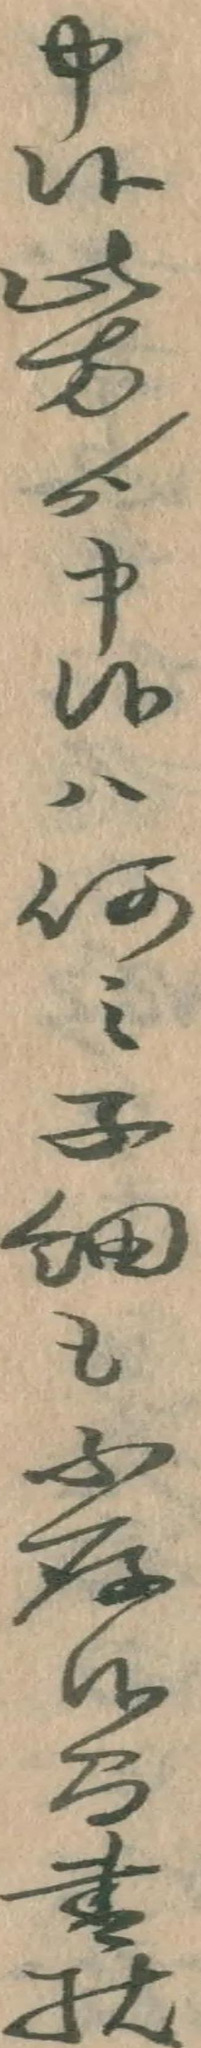申候此方ゟ申候は何之子細もふ存候間書状
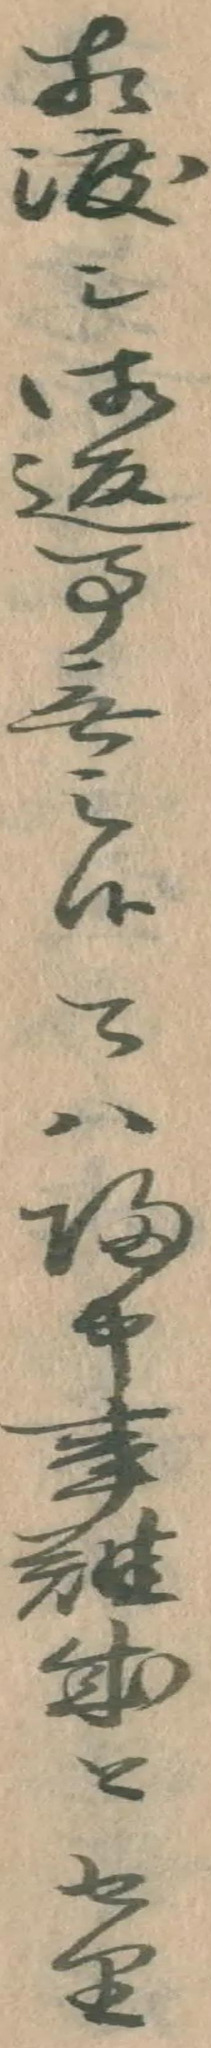相渡し御返事無之候ては帰申事難成とせ里
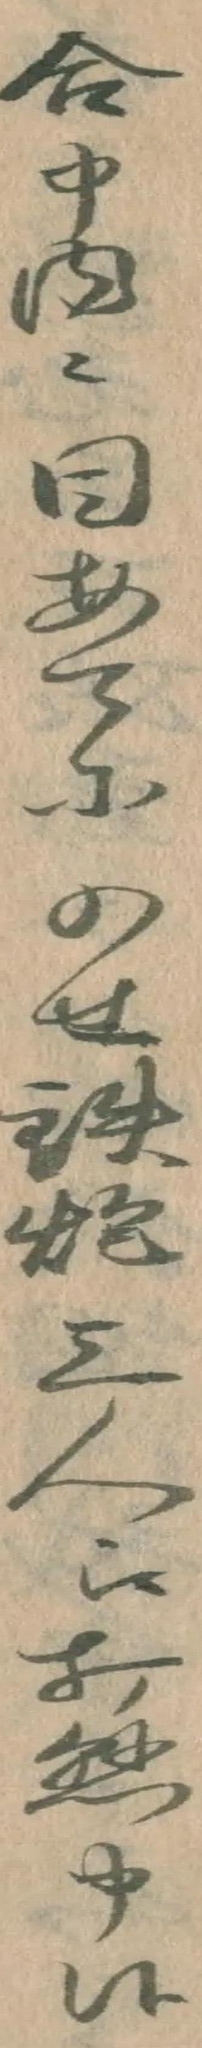合申内に目あて尓のせ鉄砲三人江打懸申候
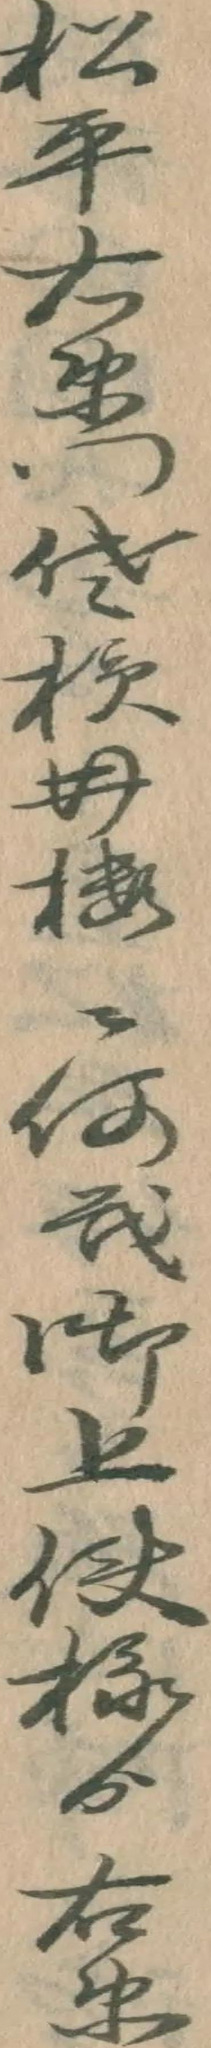松平右衛門佐様井樓に何茂御上使様ゟ右衛
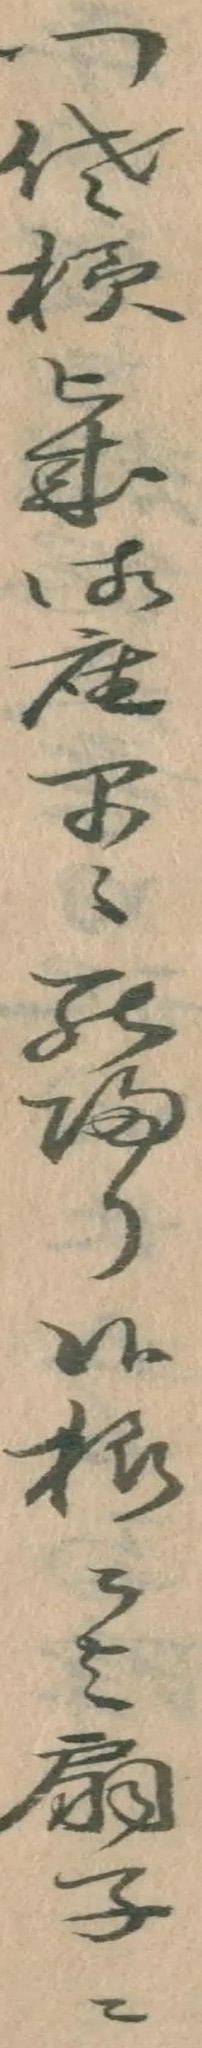門佐様被成御座早々罷帰り候様に与扇子に
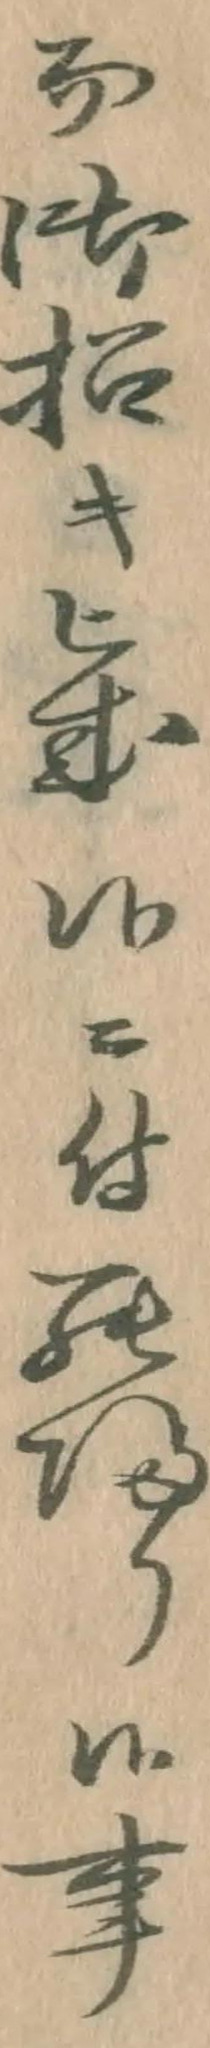次御招き被成候に付罷帰り候事

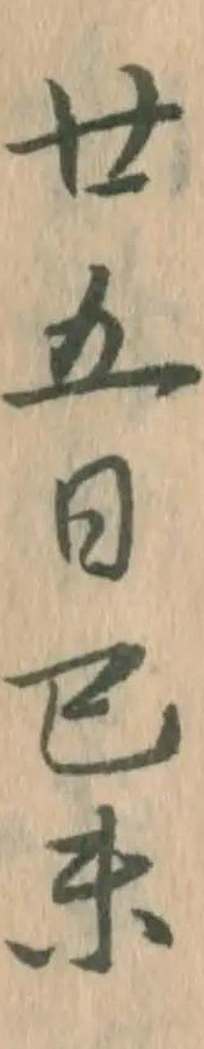廿五日己未
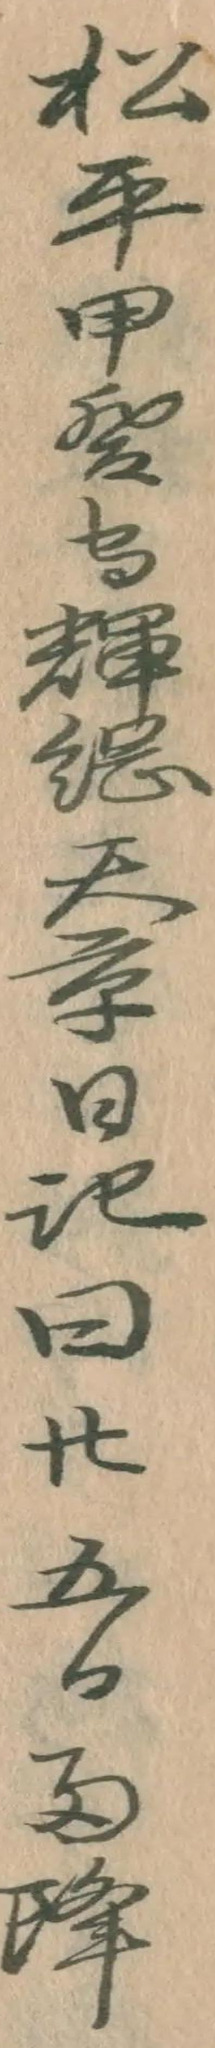松平甲斐守輝綱天草日記曰廿五日雨降
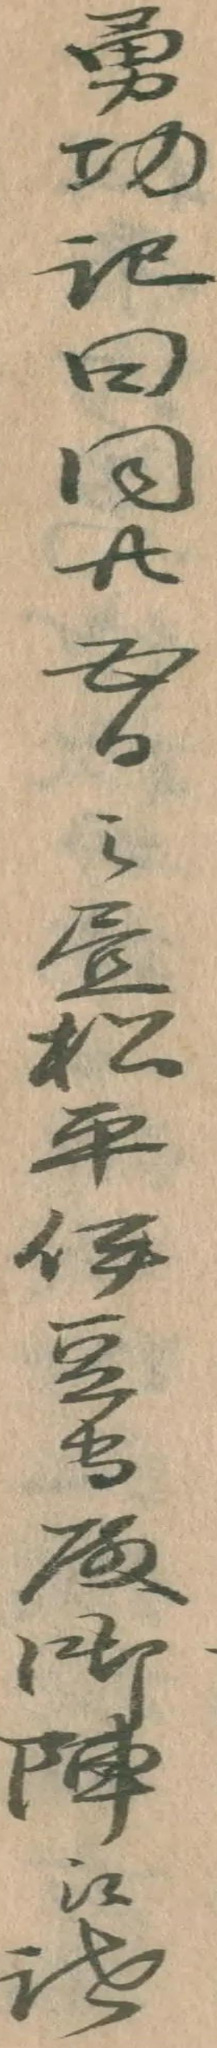勇功記曰同廿五日之昼松平伊豆守殿御陣江諸
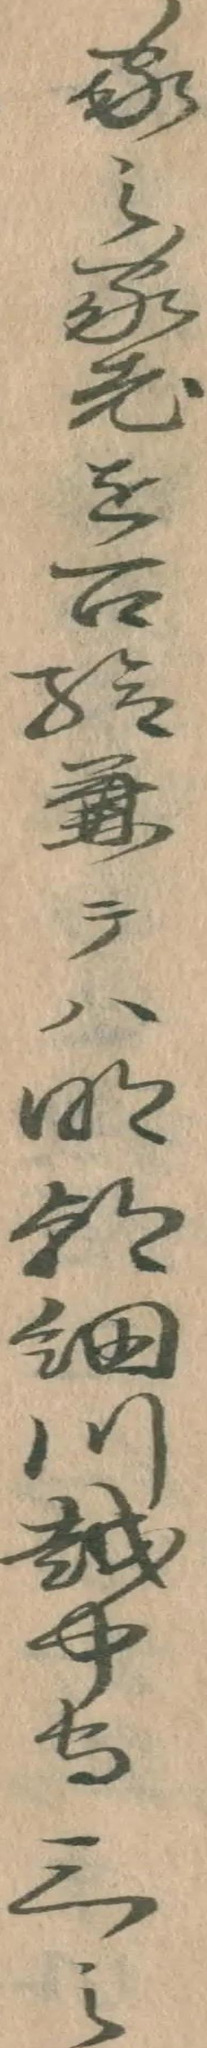家之家老を召給兼ては明朝細川越中守三之
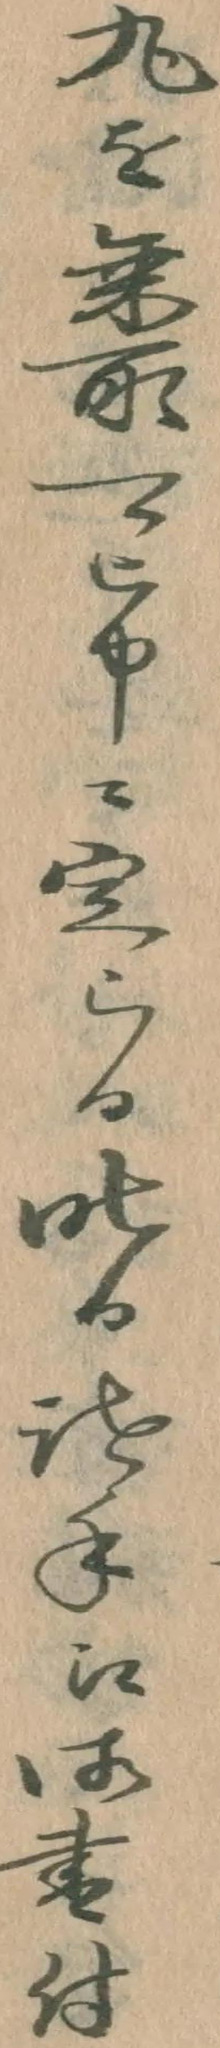丸を乗取可被申に定らる昨日諸手江御書付
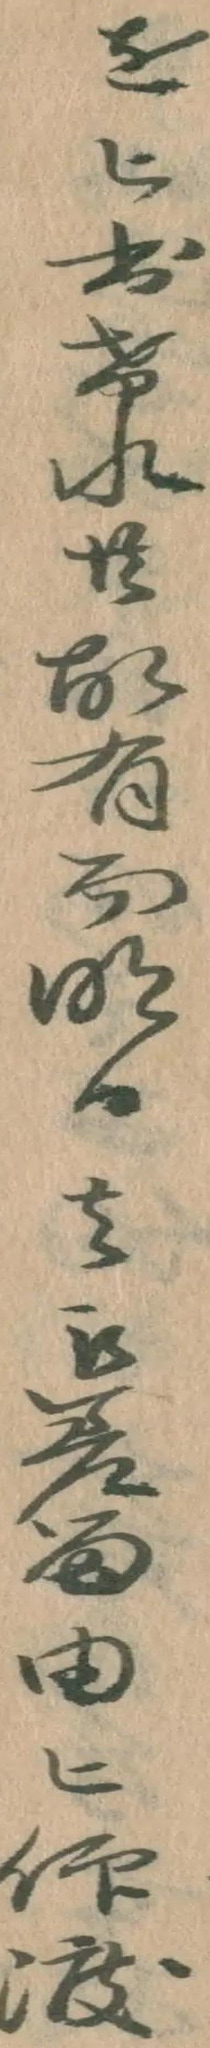を被出希れ共故有而明日者被差留由被仰渡
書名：切支丹御退治記 49巻. [7]
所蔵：国立国会図書館 National Diet Library, JAPAN
